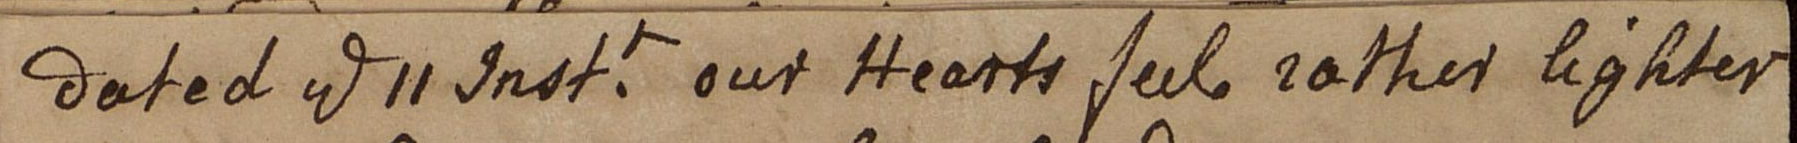dated y^e 11 Inst^t. our Hearts feel rather lighter
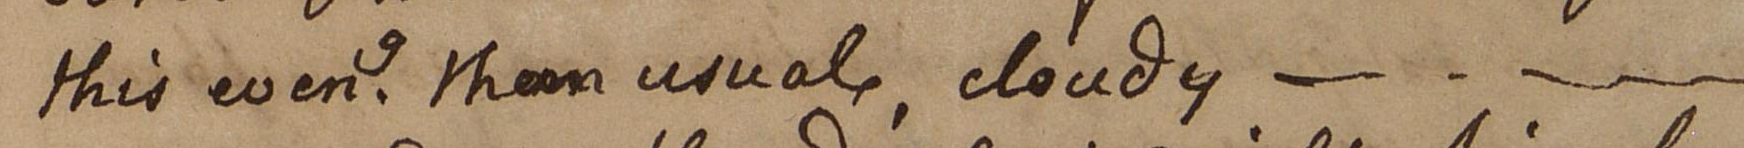this even^g. than usual, cloudy--
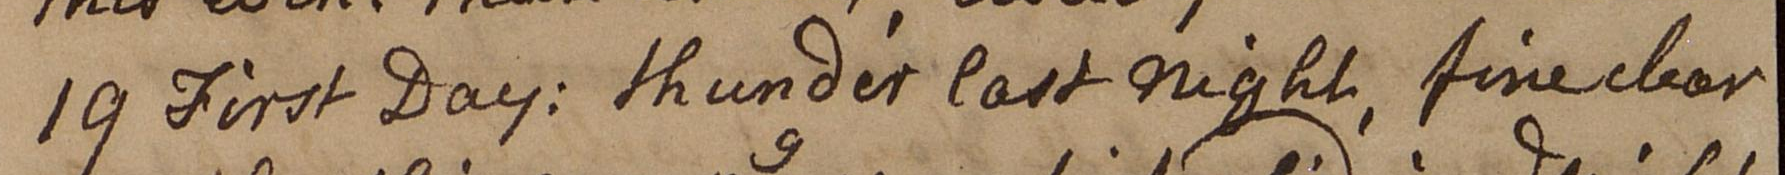19 First Day: thunder last night, fine clear
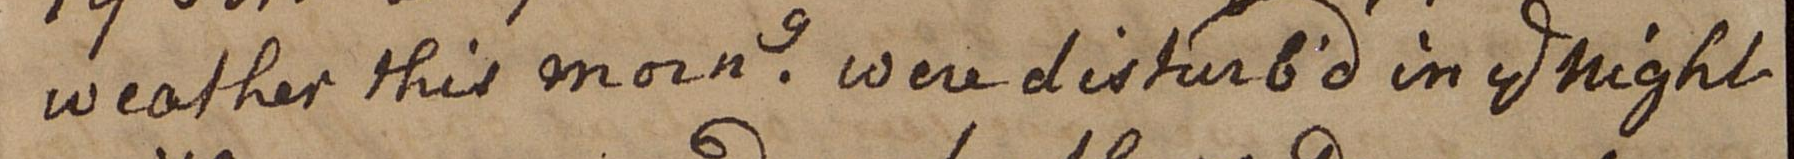weather this morn^g. were disturb'd in y^e night
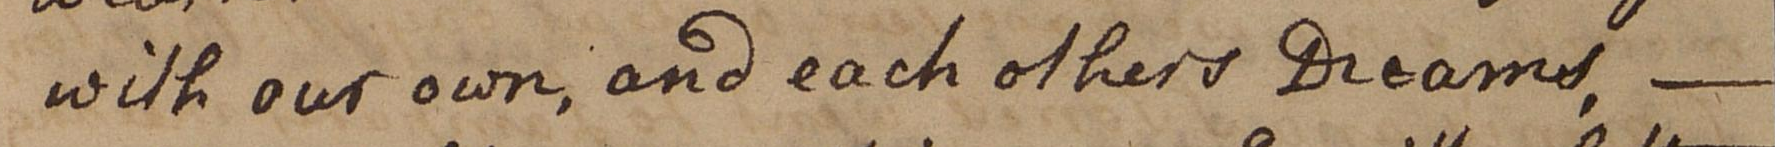with our own, and each others Dreams,-
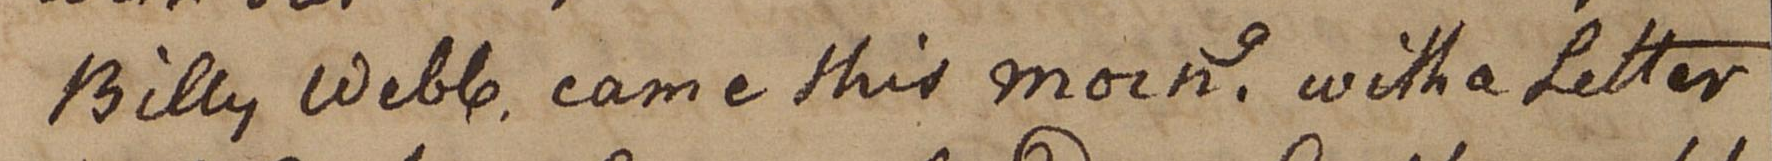Billy Webb came this morn^g. with a Letter
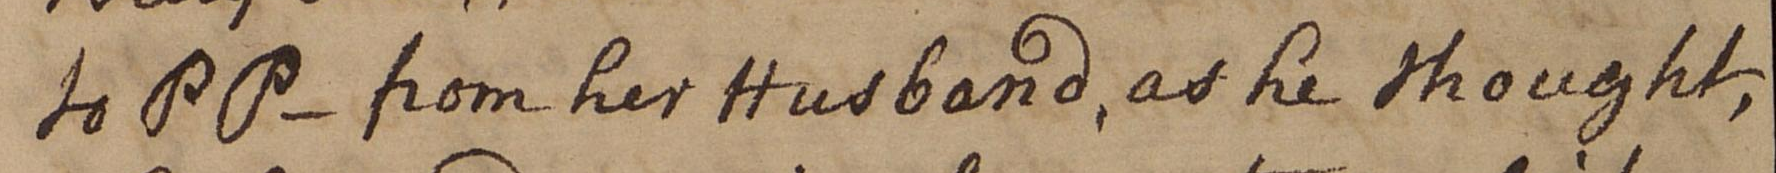to PP- from her Husband, as he thought,
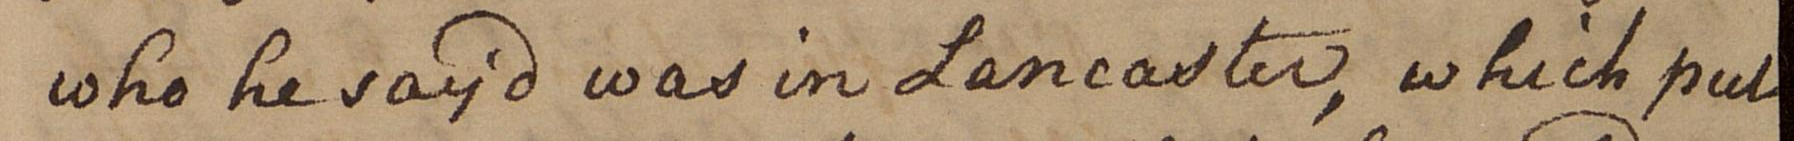who he say'd was in Lancaster, which put
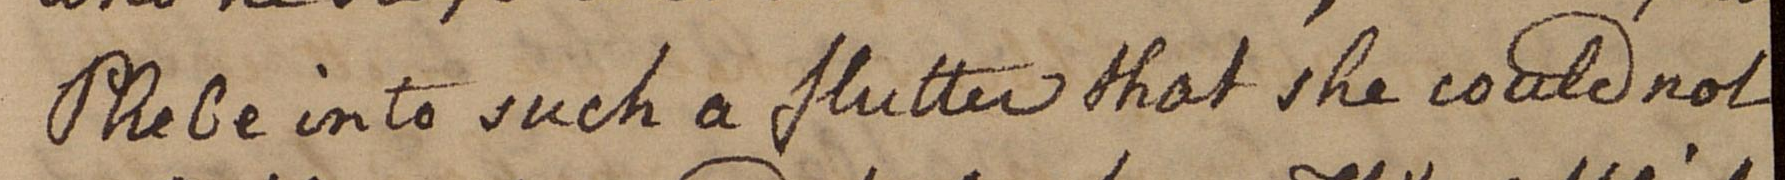Phebe into such a flutter that she could not
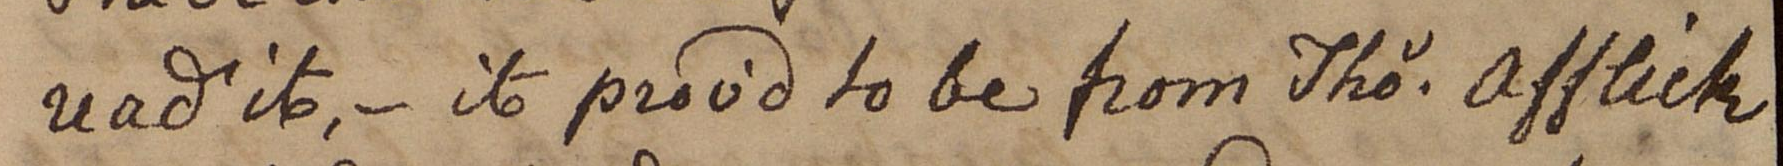read it,- it prov'd to be from Tho^s. Afflick
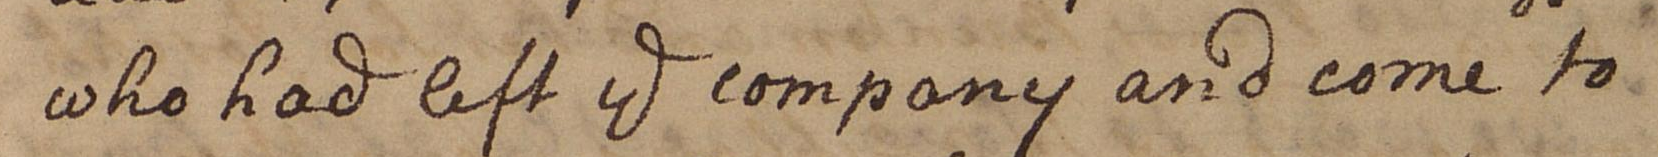who had left y^e company and come to
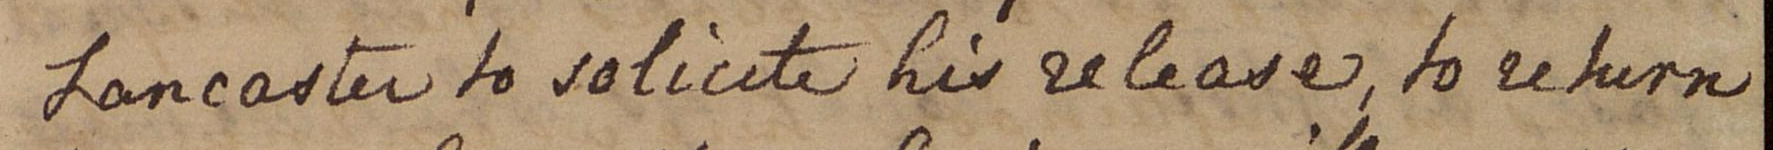Lancaster to solicite his release, to return
